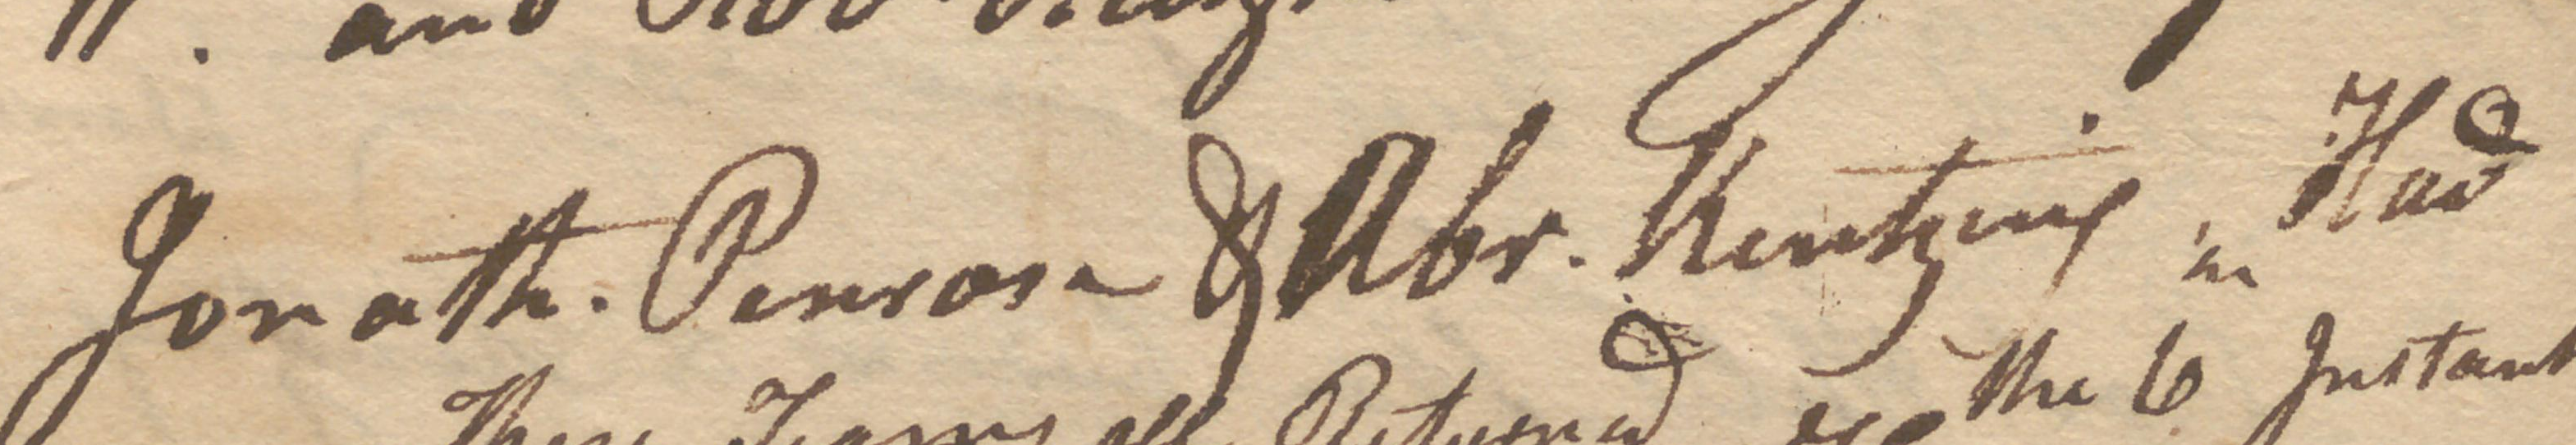Jonath. Penrose & Abr. Kintzing, Had
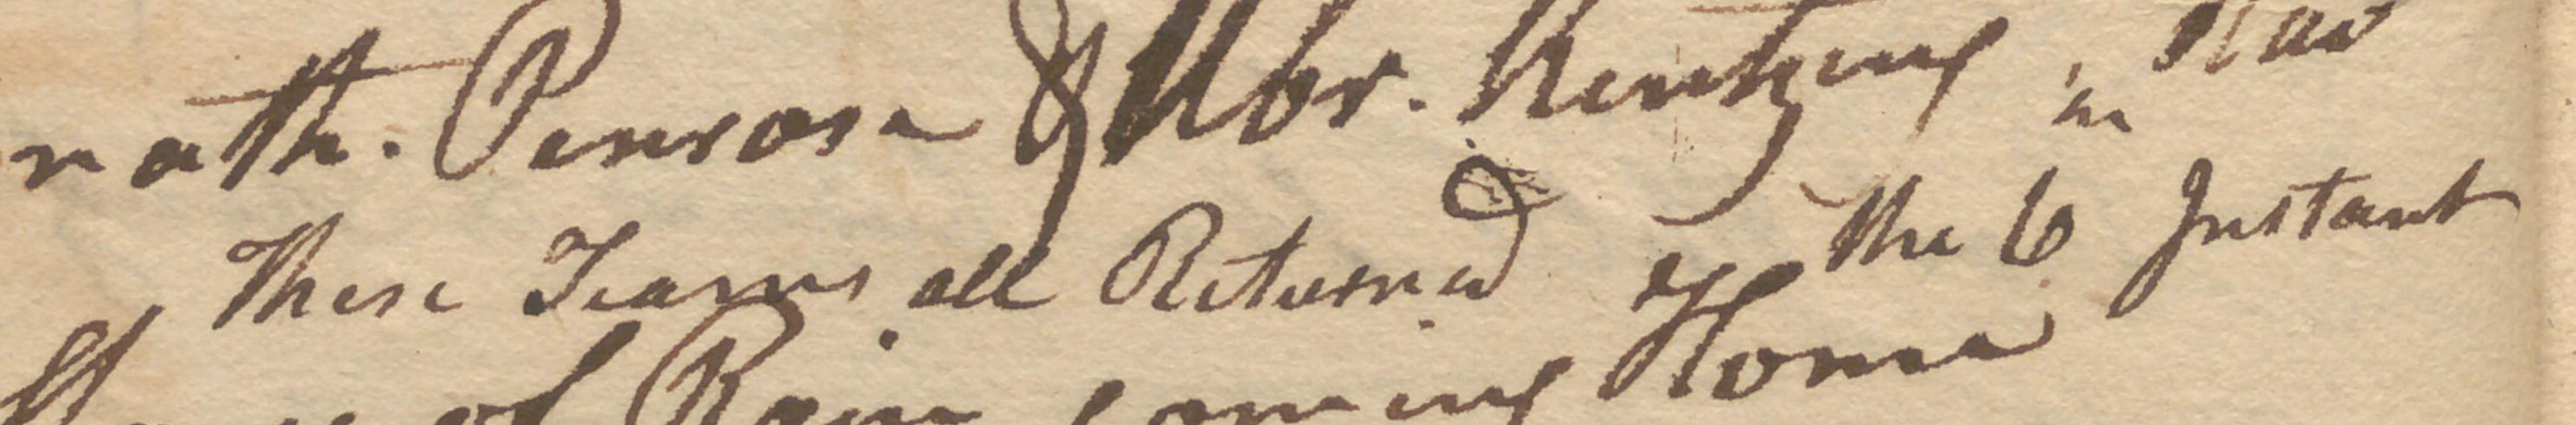These Teams all Returned the 6 Instant
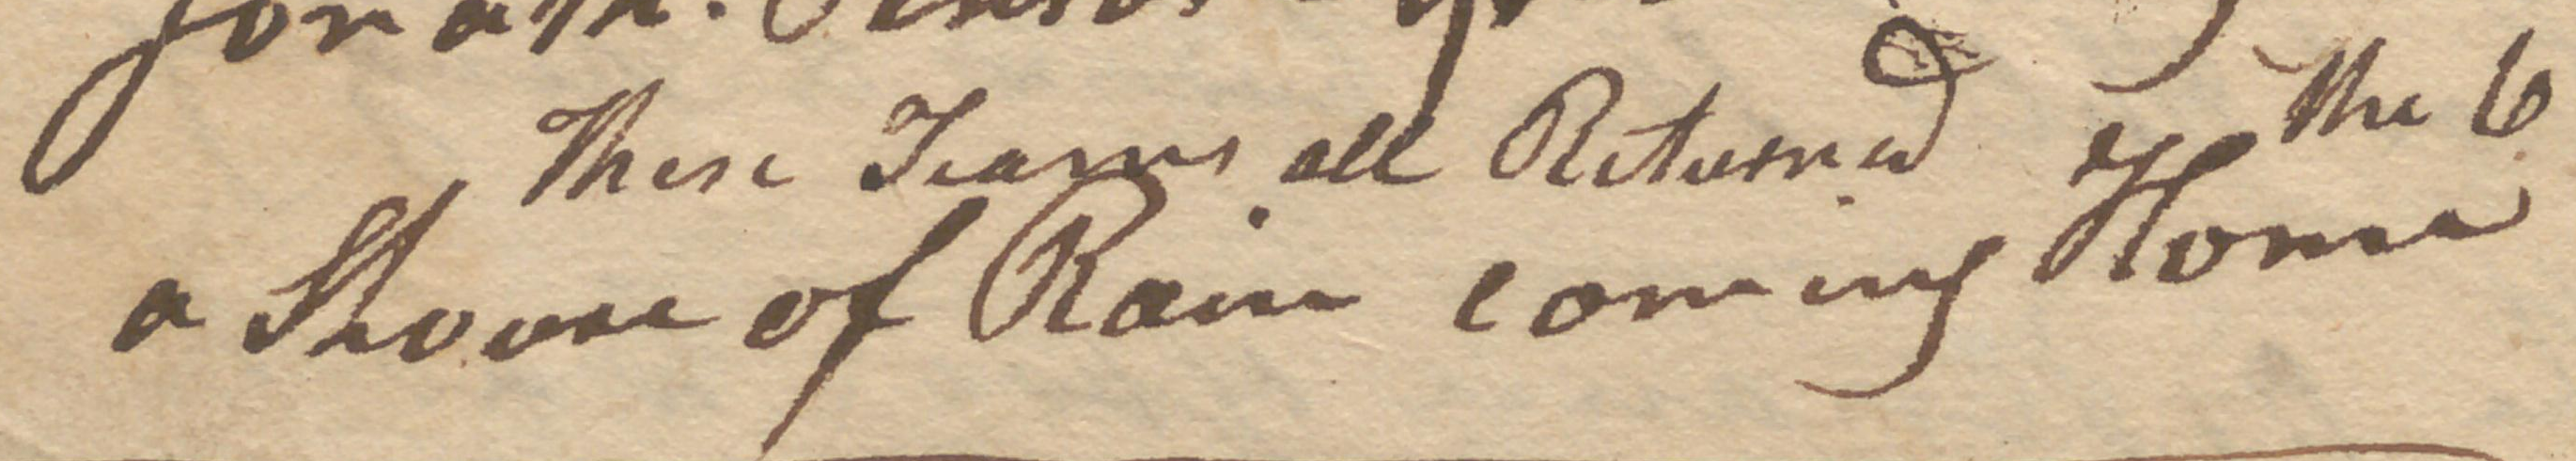a Shoure of Rain coming Home
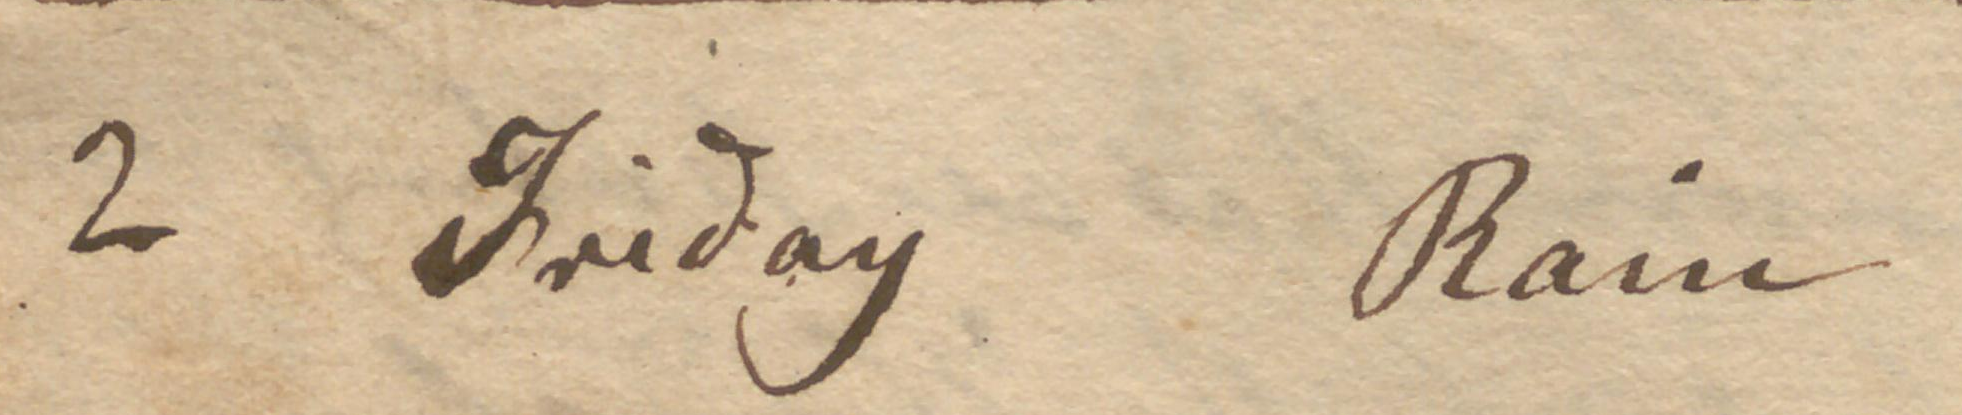2 Friday Rain
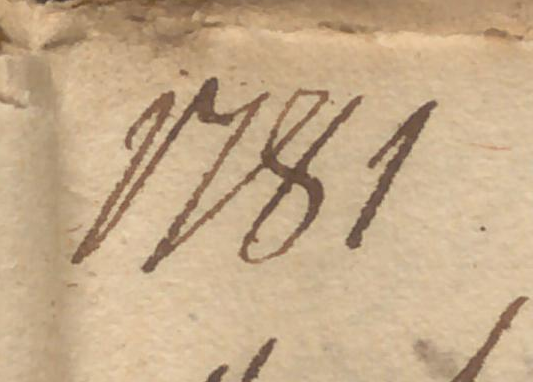1781
